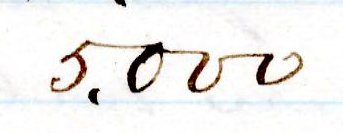5.000
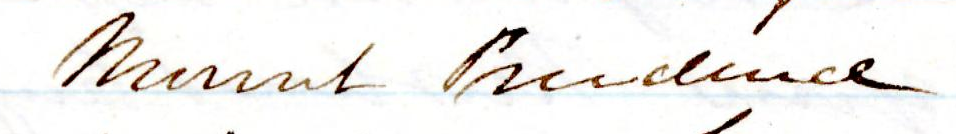Moment Prudence
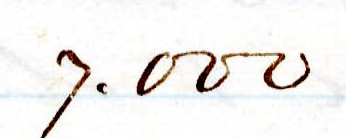7,000
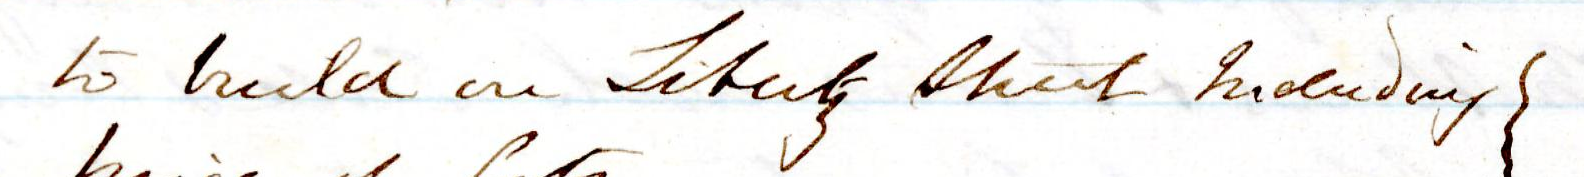to build on Liberty street holding
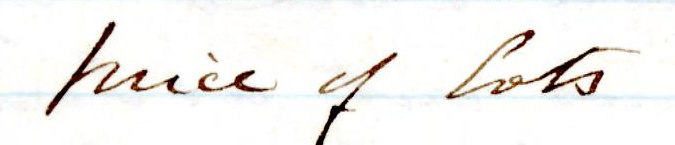price of lots
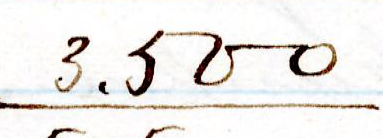3.500
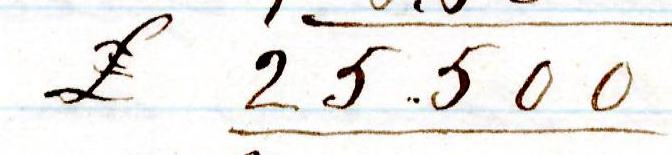£25.500
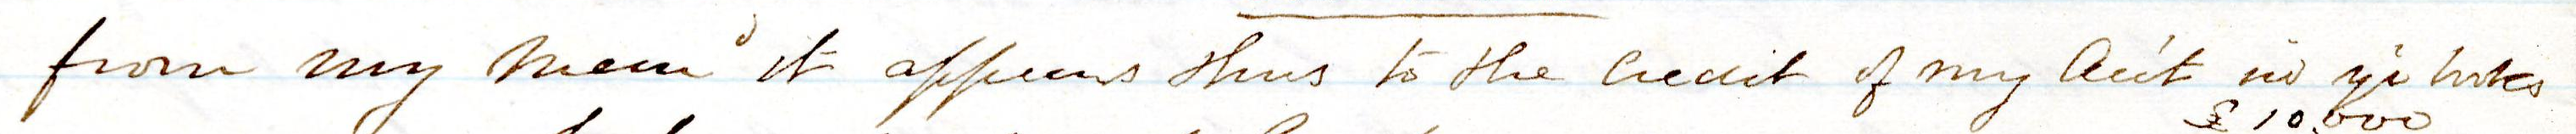from my mem^d it appears shares to the Credit of my Acc't in ye books
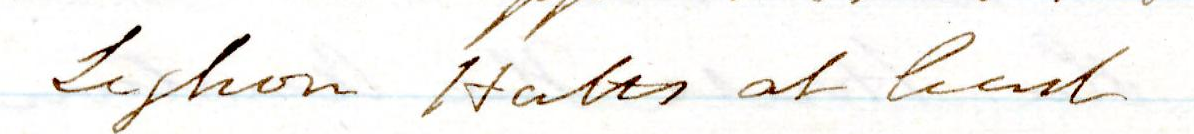Leghorn Halts at least
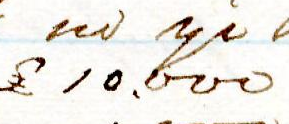£10.000
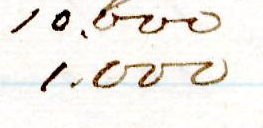1.000
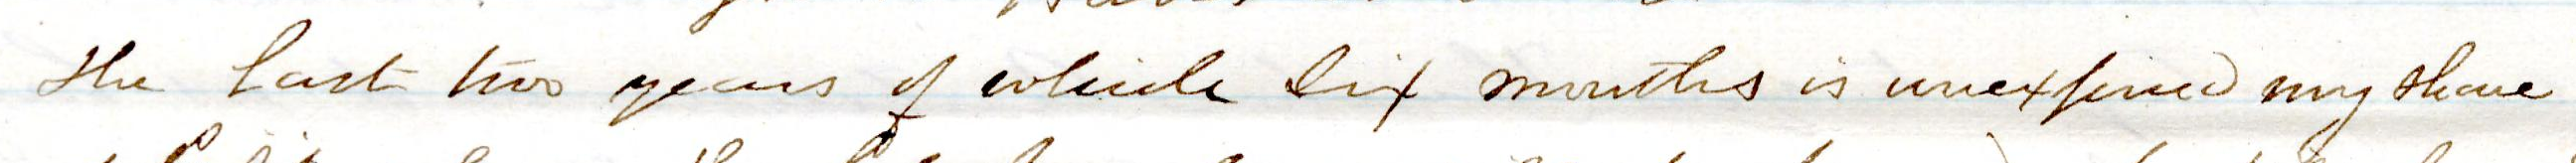the last few years of while six months is unexpired my share
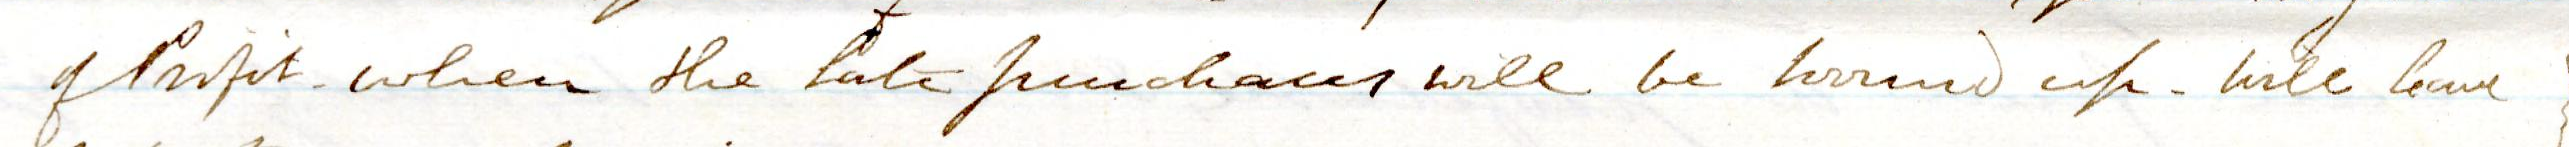of profit when the late purchases will be turned up- will leave
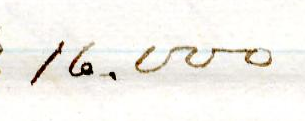16.000
